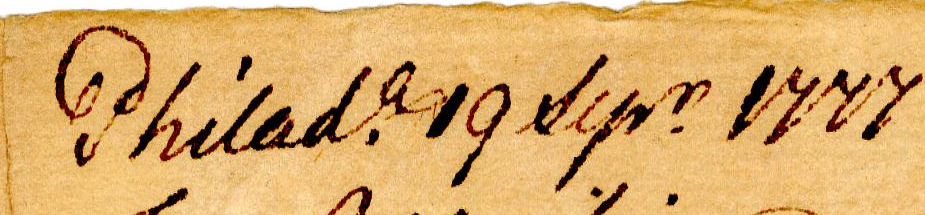Philad^a. 19 Sep^r. 1777
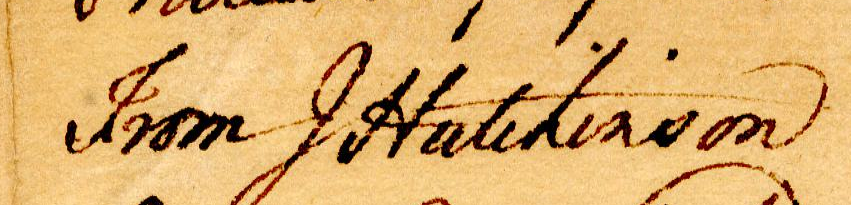From J Hutchinson
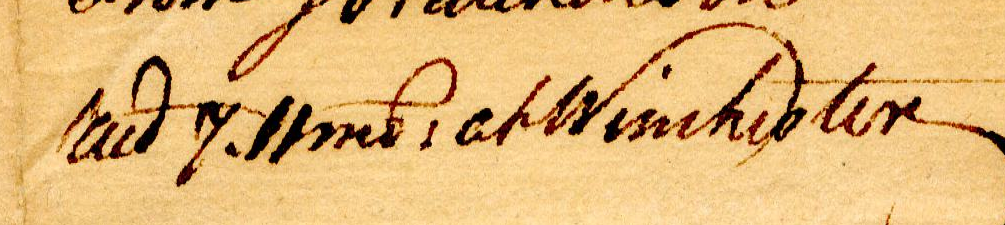recd 7. 11mo: at Winchester
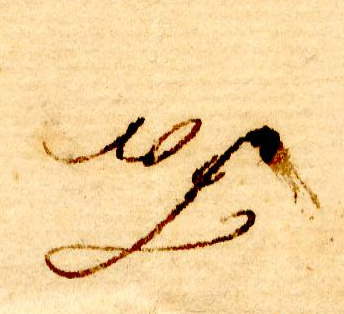For
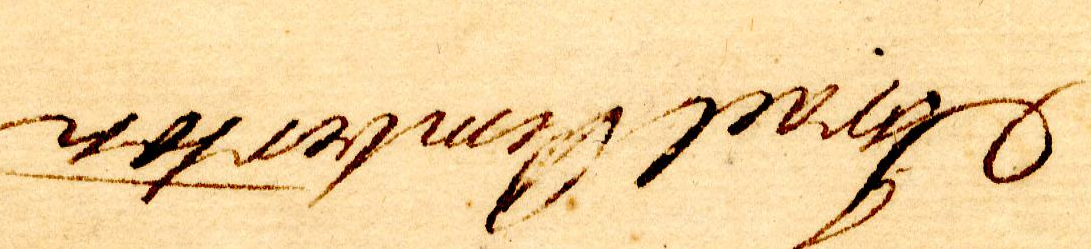Israel Pemberton
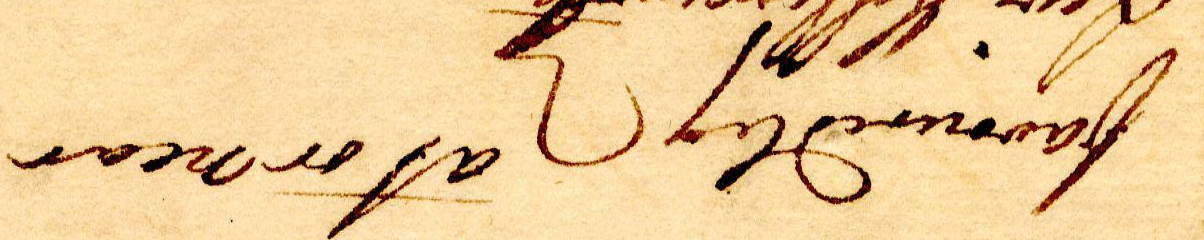favoured by, at or near
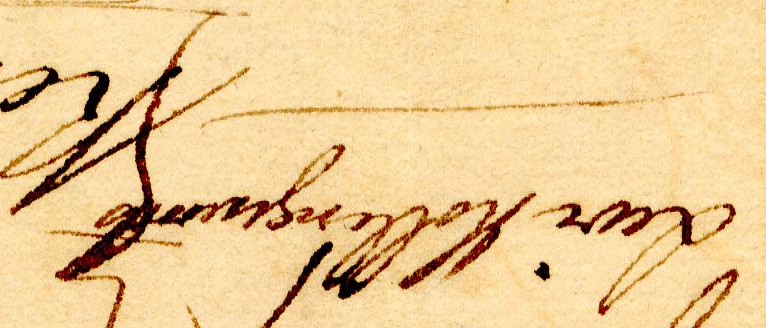Leving Hollingworth
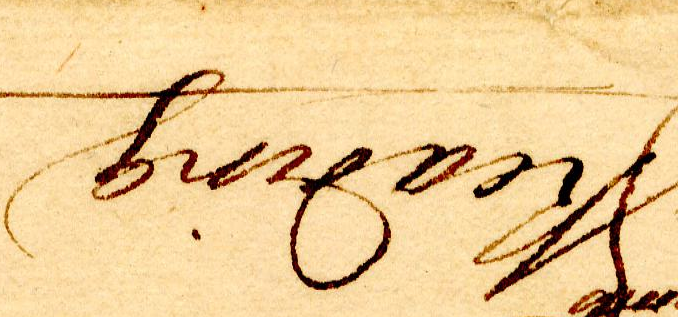Reading
